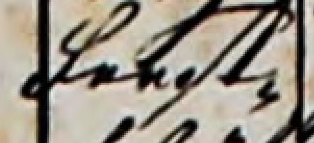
Forst„
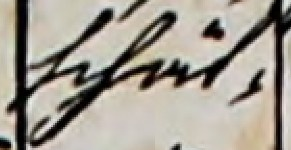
schät„
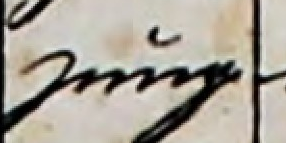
zung
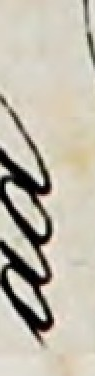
ad
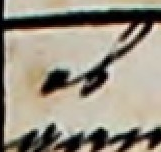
ob
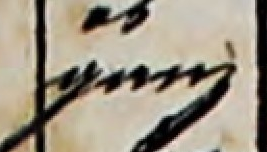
ganz
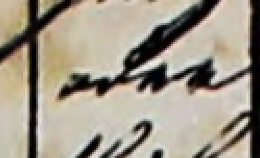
oder
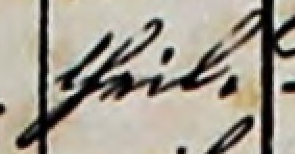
theil„
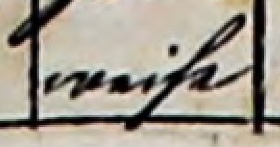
weise
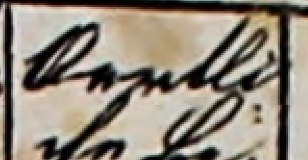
Oertli„
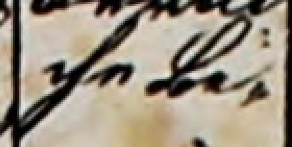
che Be„
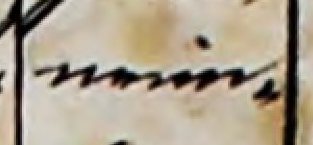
nenn„
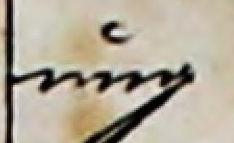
ung
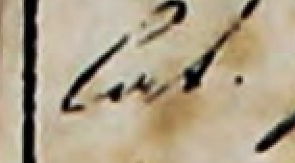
Cat.
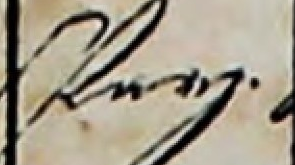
Parz.
